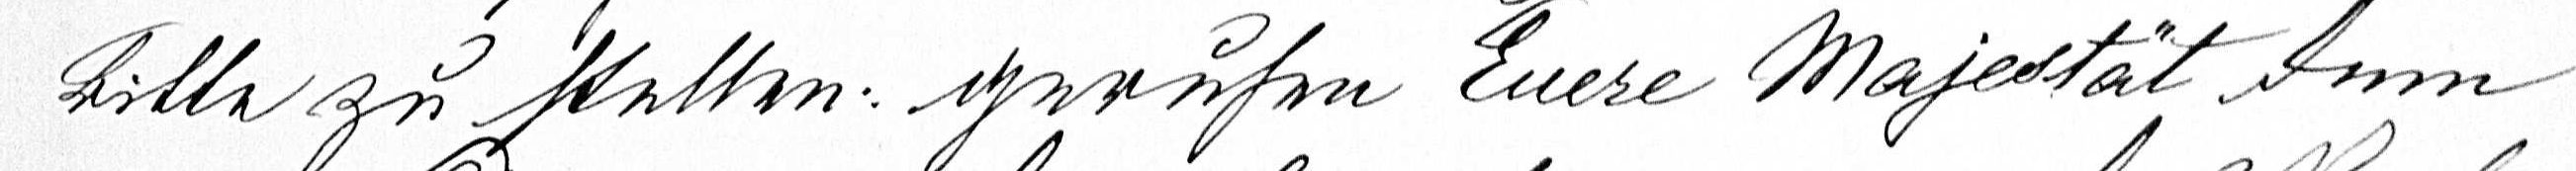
Bitte zu stellen: geruhen Euere Majestät dem
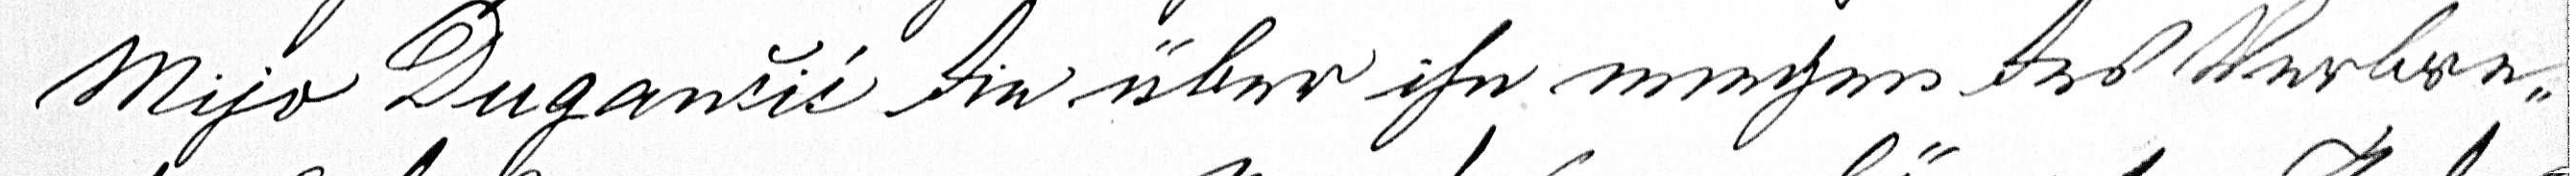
Mijo Dugančić die über ihn wegen des Verbre¬
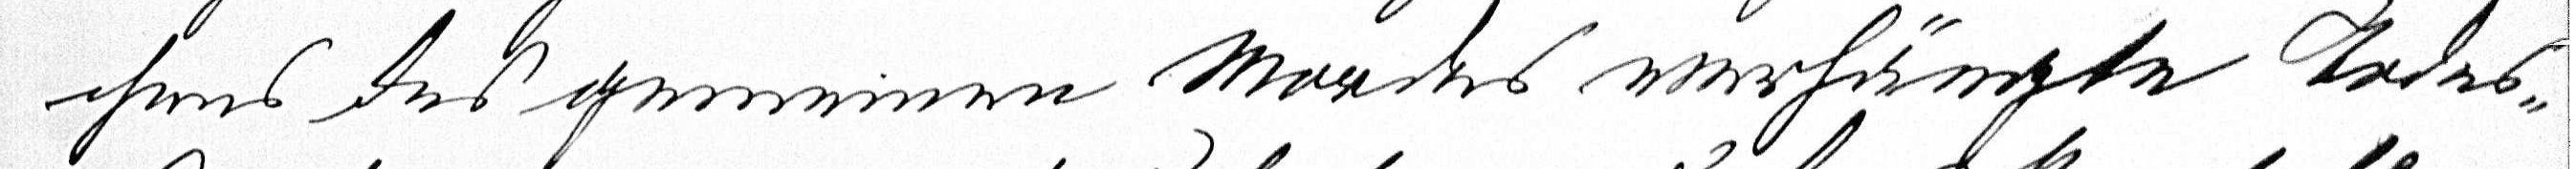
chesn des gemeinen Mordes verhängte Todes¬
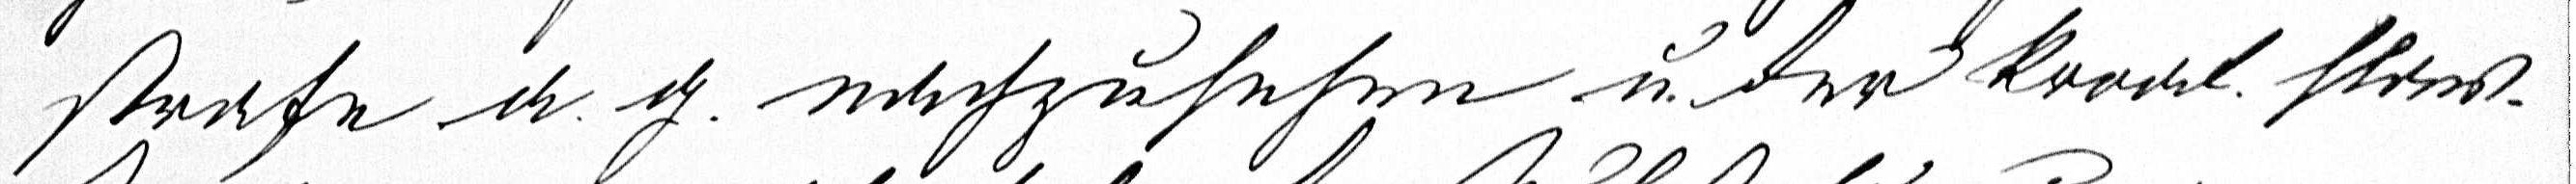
strafe a.g. nachzusehen u. der kroat. slaw.
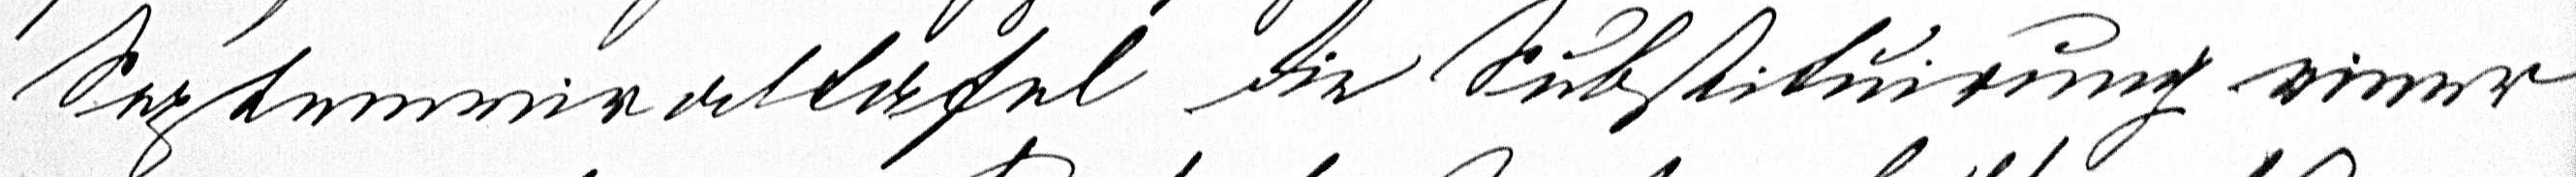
Septemviraltafel die Substituirung einer
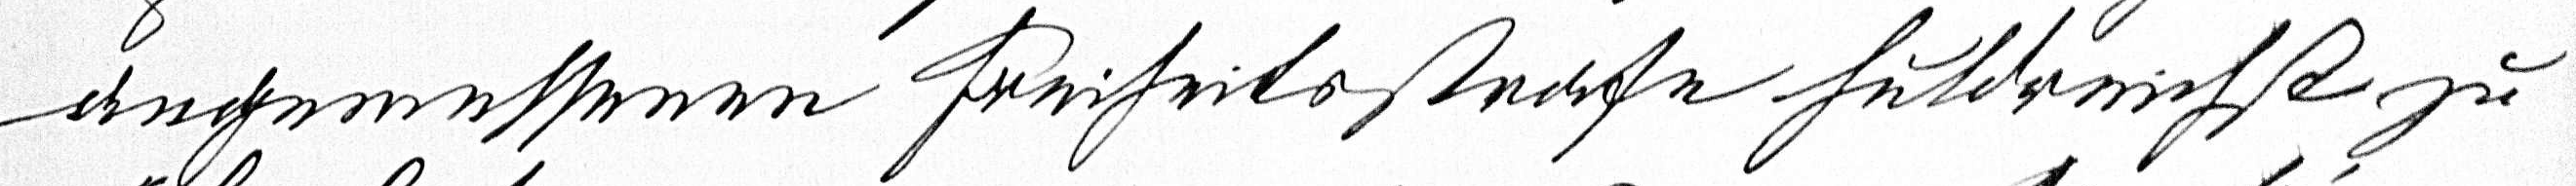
angemessenen Freiheitsstrafe huldreichst zu
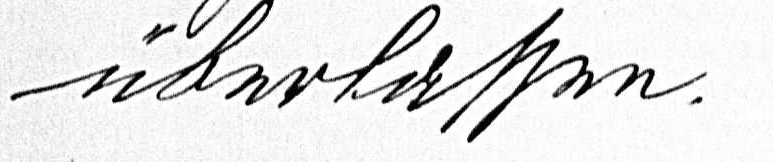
überlassen.
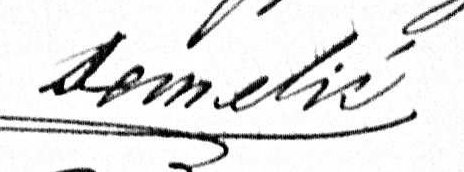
Dometić
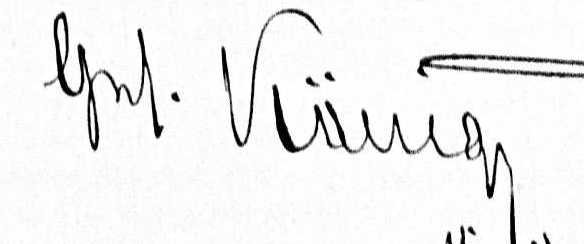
Ges. König
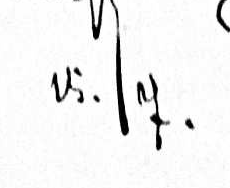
15/7
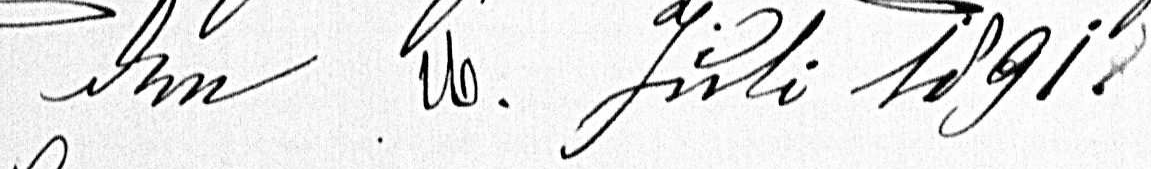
den 16. Juli 1891
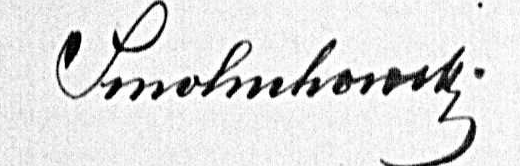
Smolnchowski
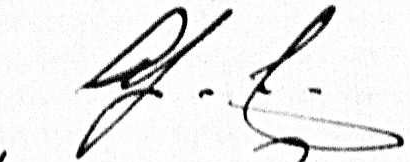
Ah. E.
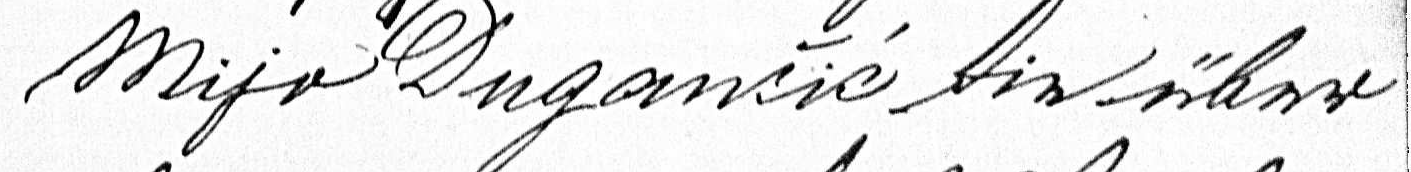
Mijo Dugančić die über
